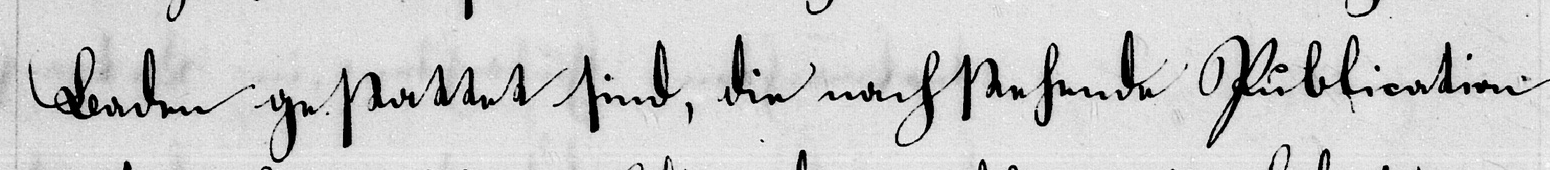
Baden gestattet sind, die nachstehende Publication
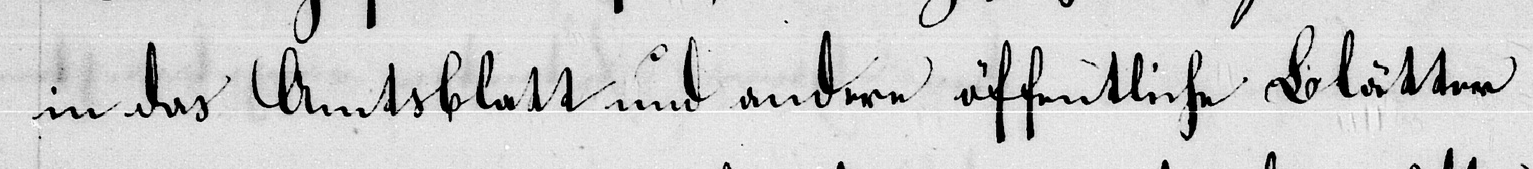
in das Amtsblatt und andere öffentliche Blätter
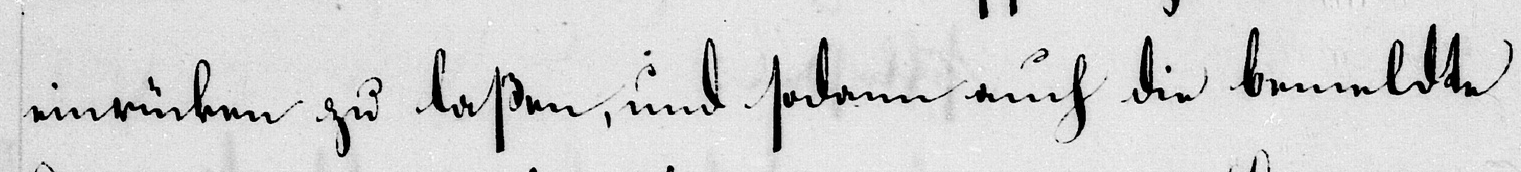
einrücken zu laßen, und sodann auch die bemeldte
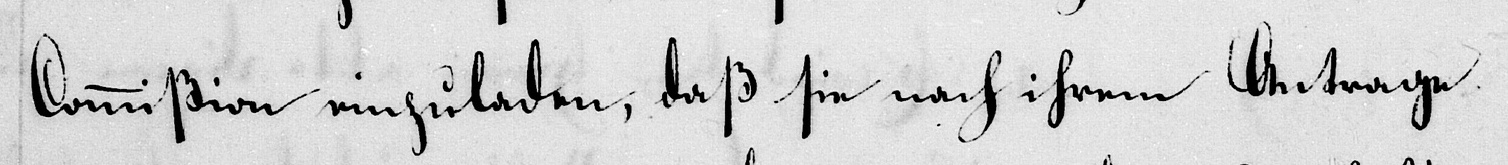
Commißion einzuladen, daß sie nach ihrem Antrage
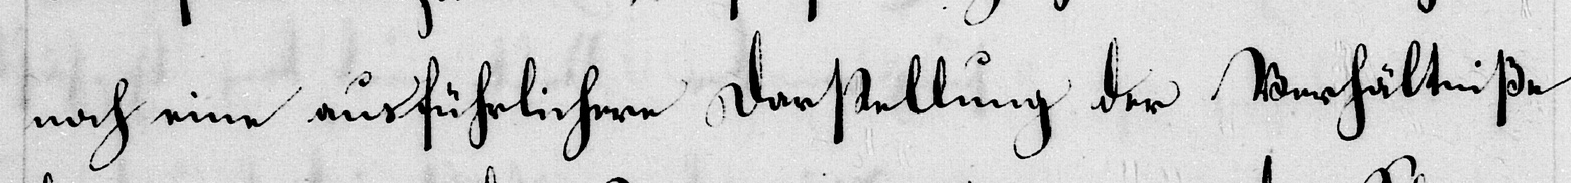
nach eine ausführlichere Darstellung der Verhältniße
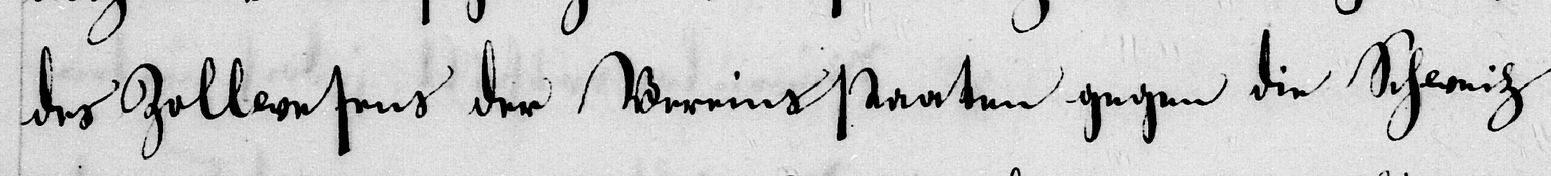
des Zollwesens der Vereinsstaaten gegen die Schweiz
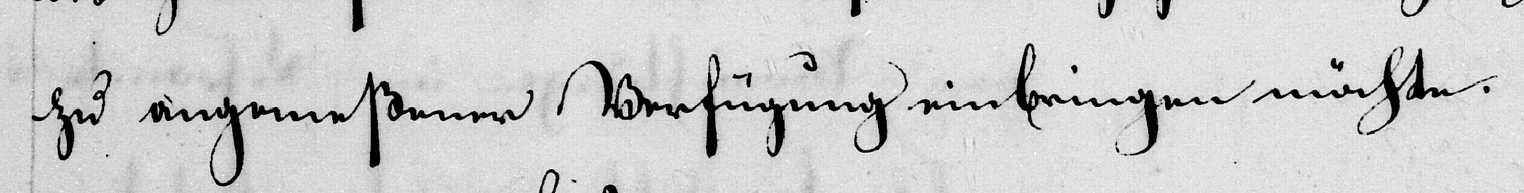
zu angemeßener Verfügung einbringen möchte.
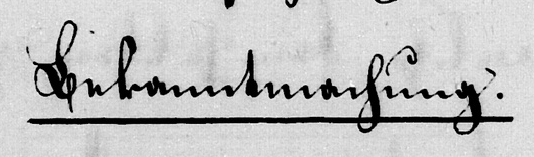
Bekanntmachung.
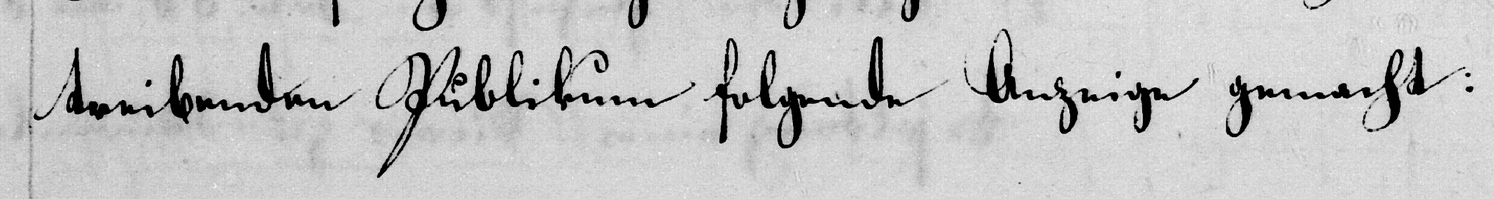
treibenden Publikum folgende Anzeige gemacht:
